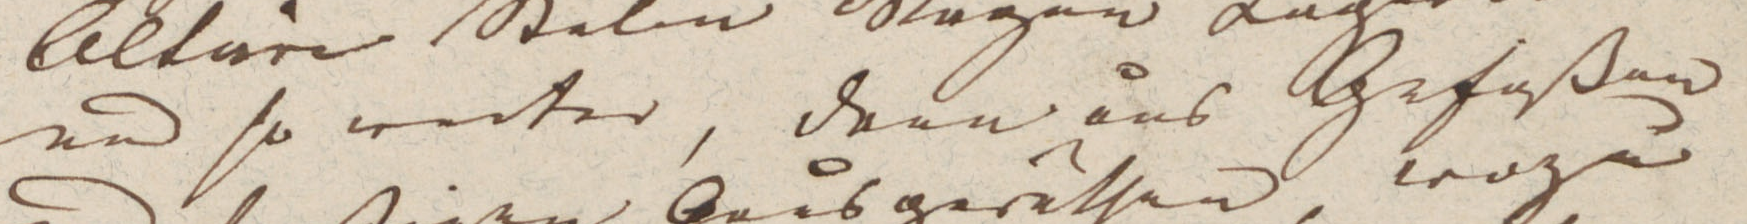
und so weiter, dann aus Gefässen
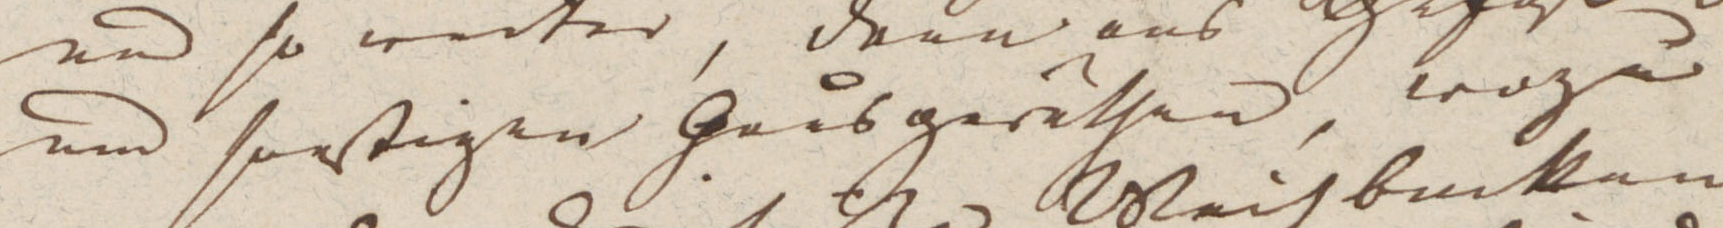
und sonstigen Hausgeräthen, wozu
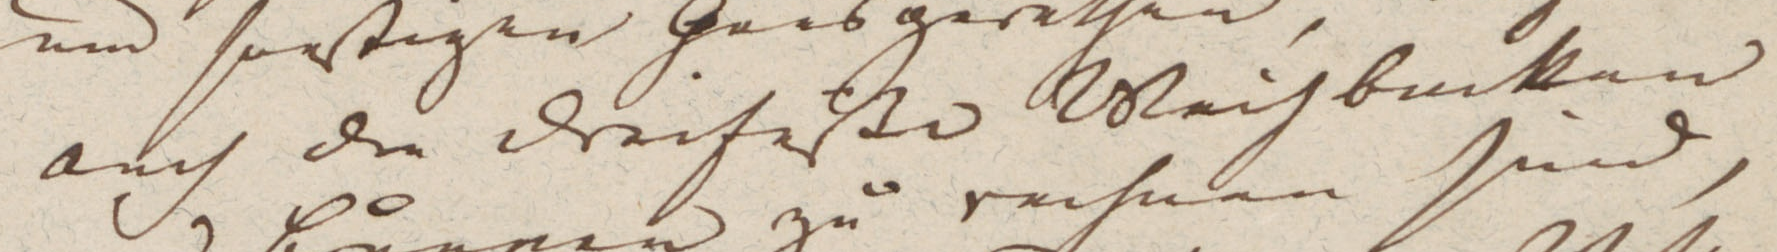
auch die Dreifüsse Weihbecken
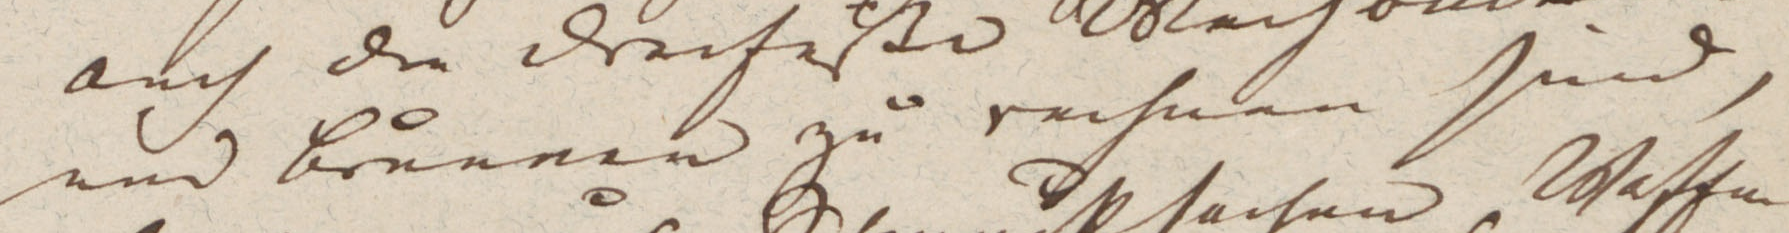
und Brunnen zu rechnen sind,
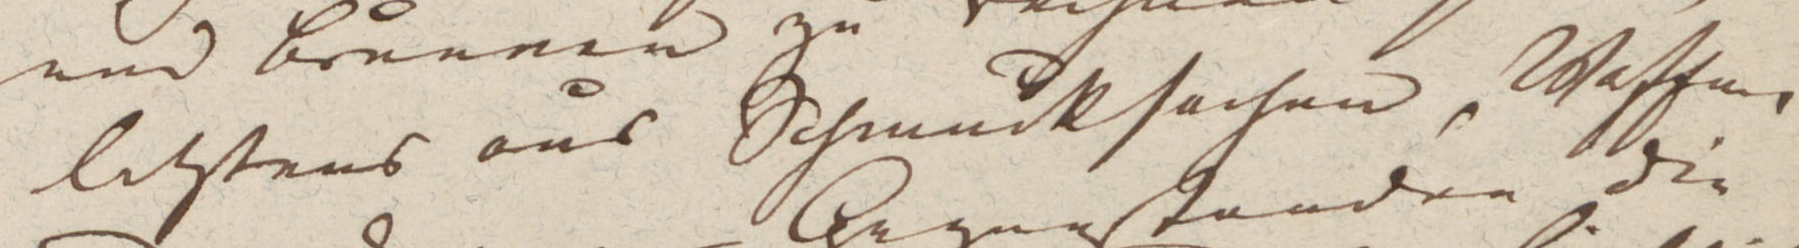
letztens aus Schmucksachen, Waffen
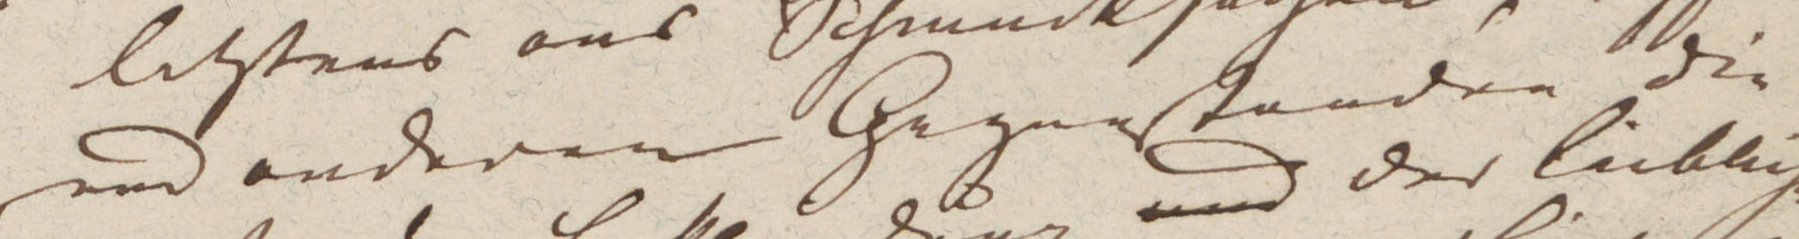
und anderen Gegenstanden die
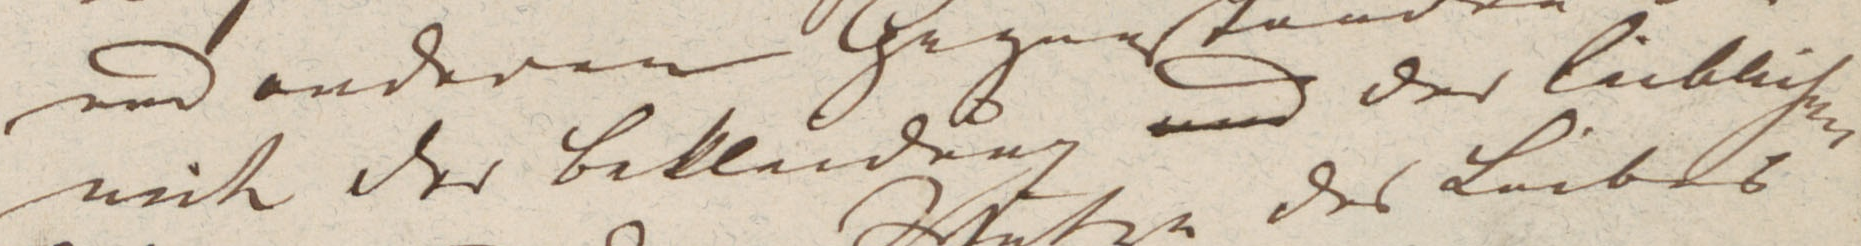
mit der Bekleidung und der leiblichen
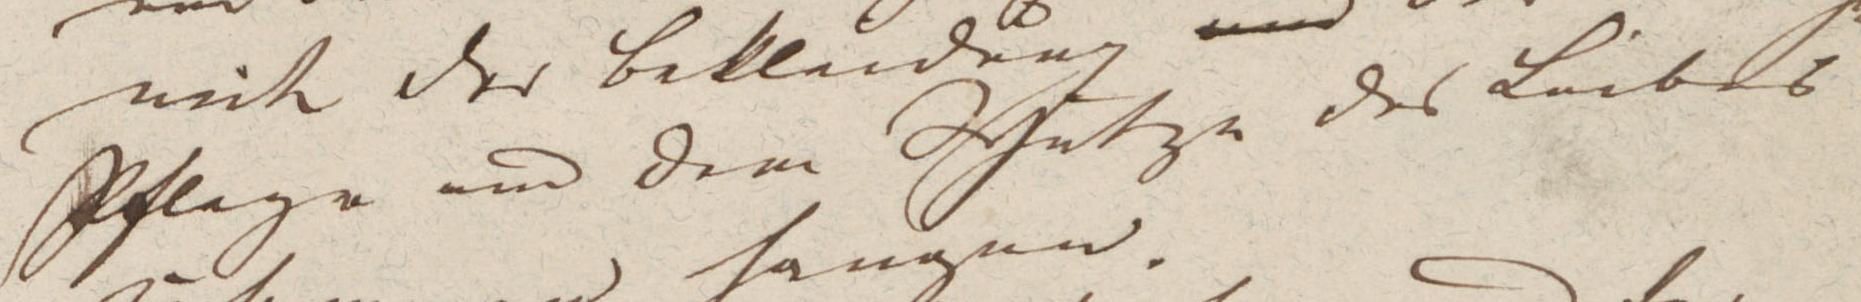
Pflege und dem Schutze des Leibes
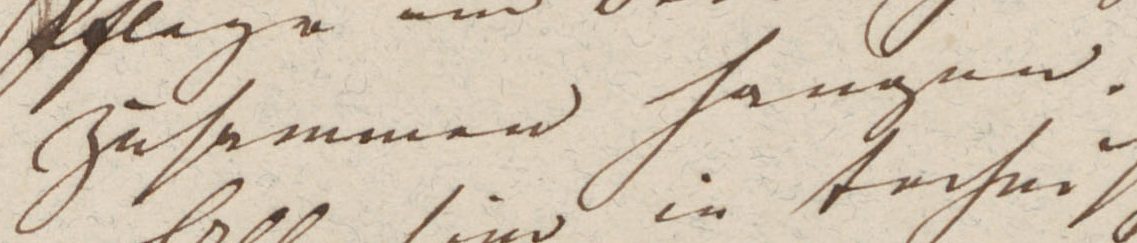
zusammen hangen.
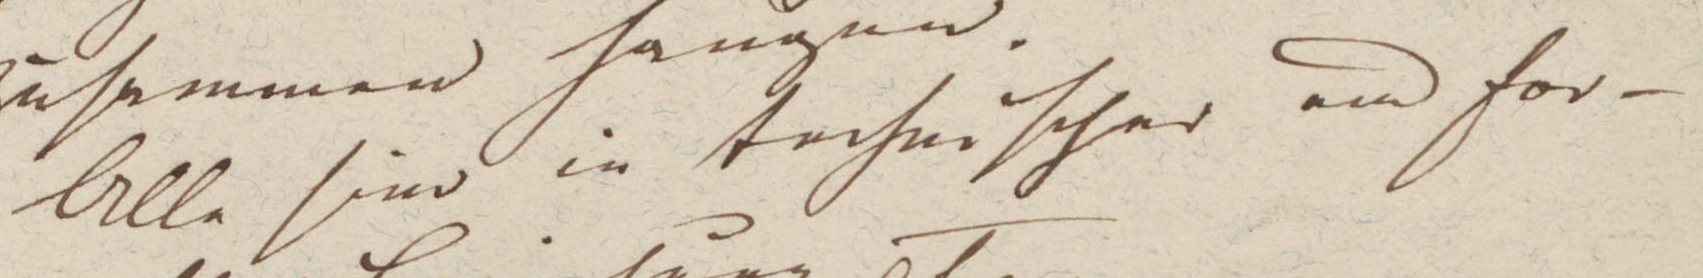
Alle sind in technischer und for-
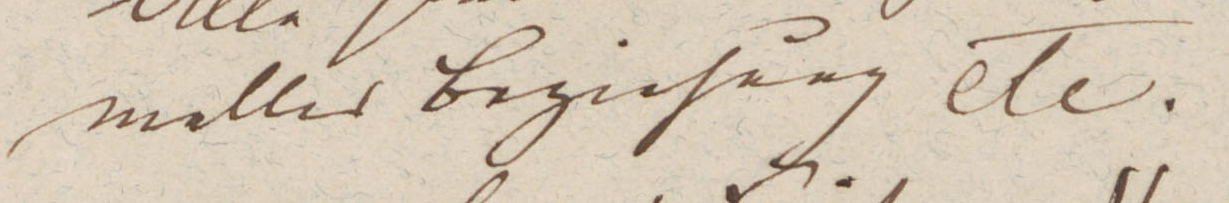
meller Beziehung etc.
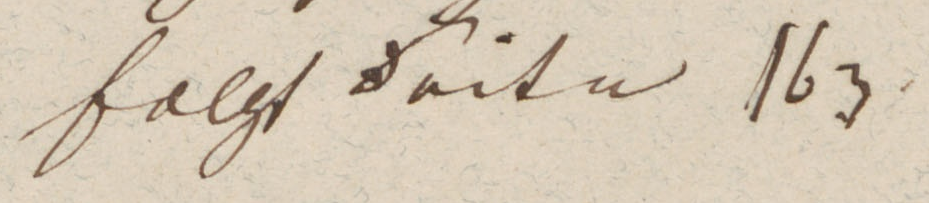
folgt Seite 163
